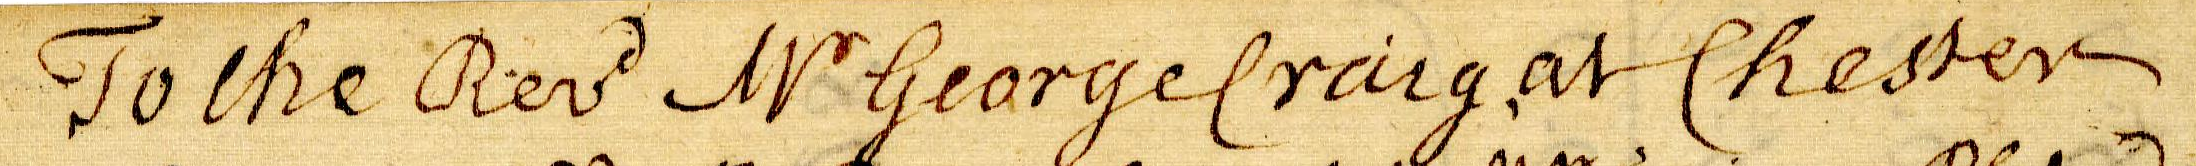To the Rev^d M^r George Craig, at Chester
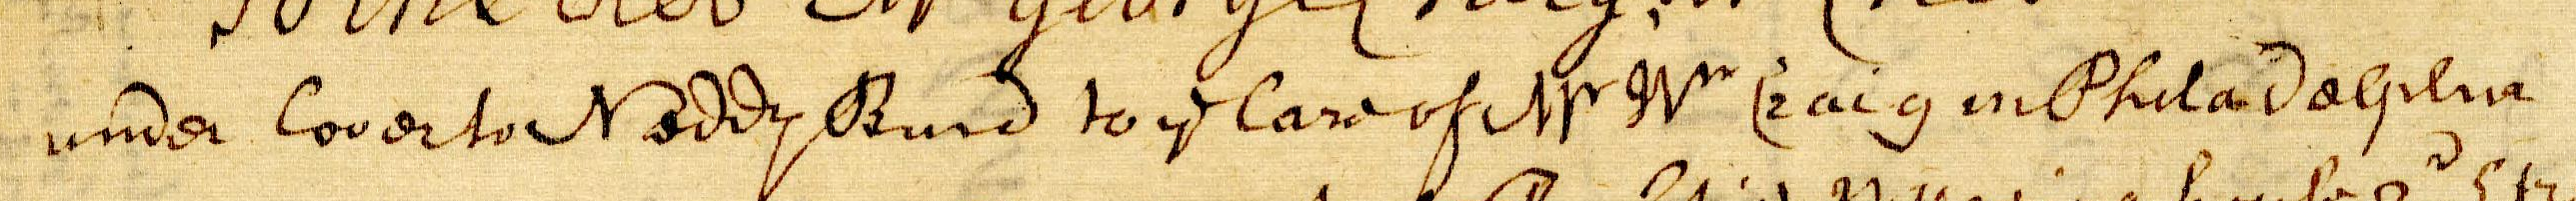under Cover to Neddy Burd to y^e Care of M^r W^m Craig in Philadelphia
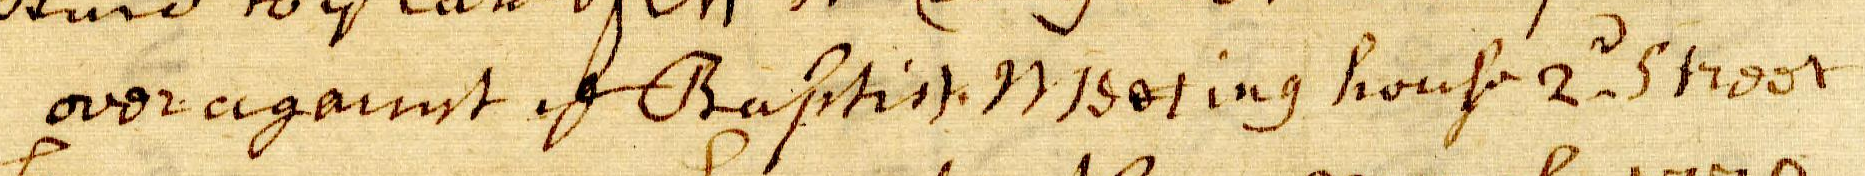over against y^e Baptist Meeting house 2^d. Street
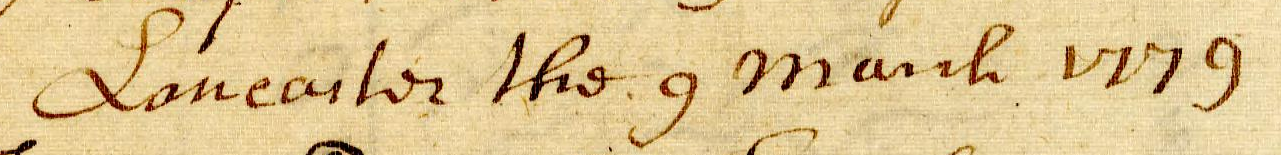Lancaster the 9 March 1779
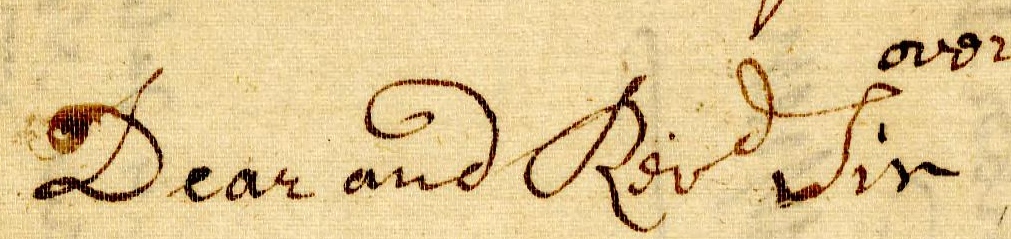Dear and Rev^d Sir
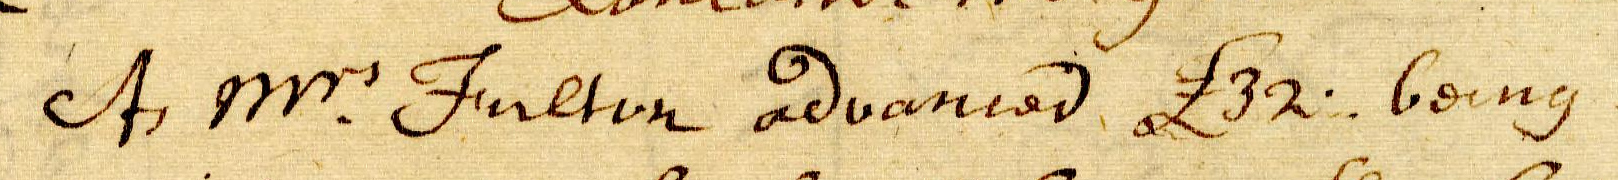A M^rs. Fulton advanced £32: being
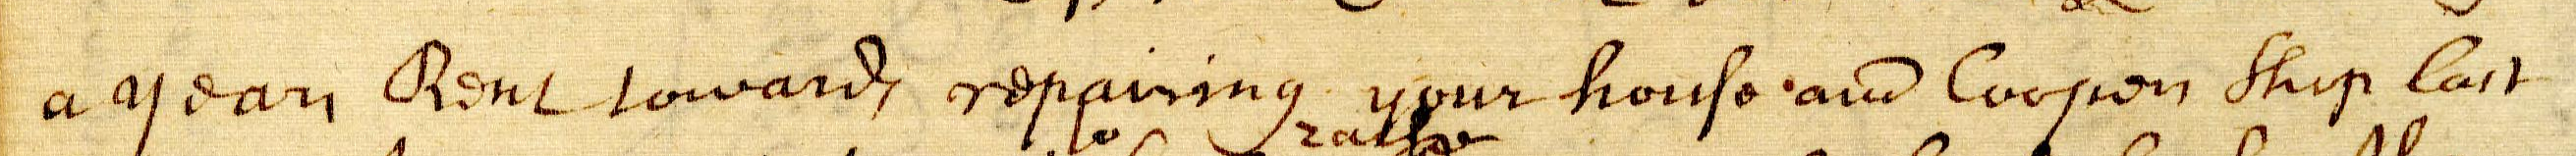a year Rent towards repairing your house and Coopers Shop last
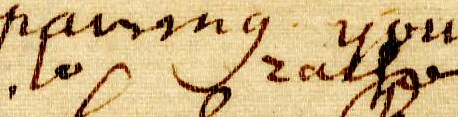to raise
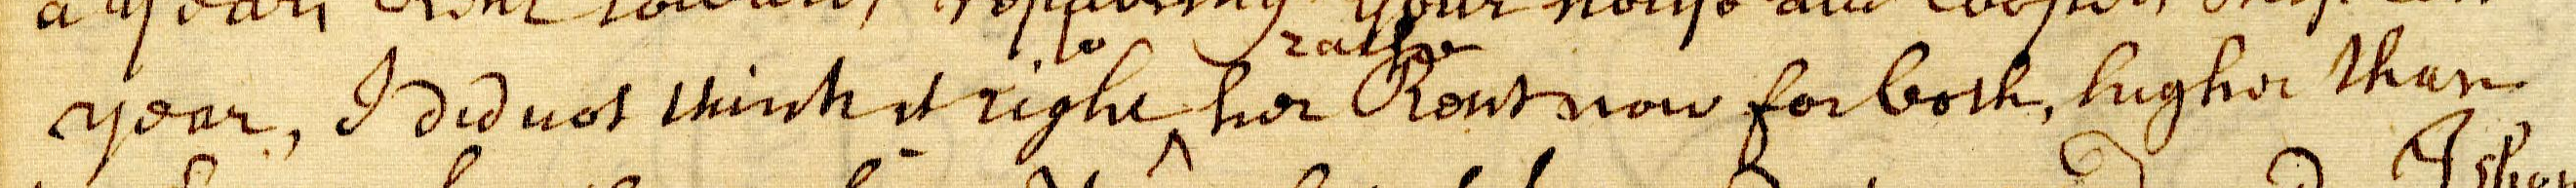year, I did not think it right ^ her Rent now for both, higher than
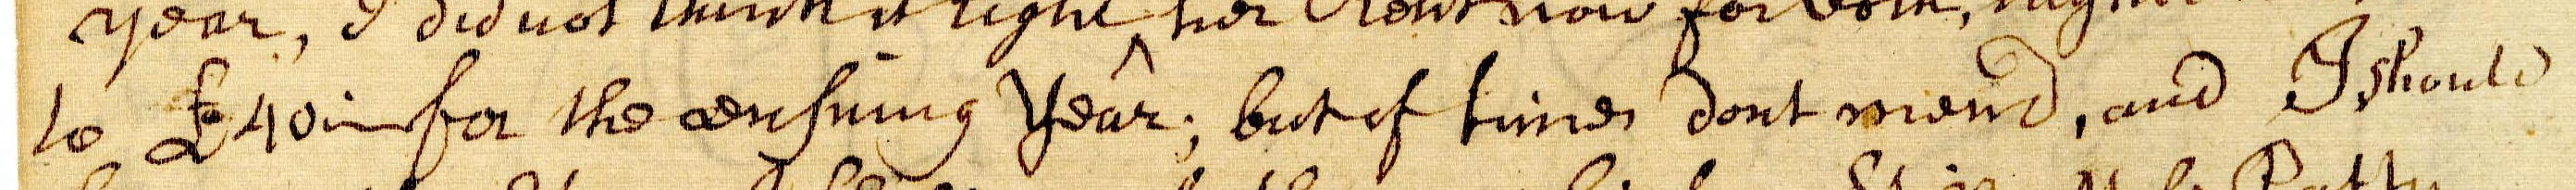to £40 ; for the ensuing Year, but if times dont mend, and I should
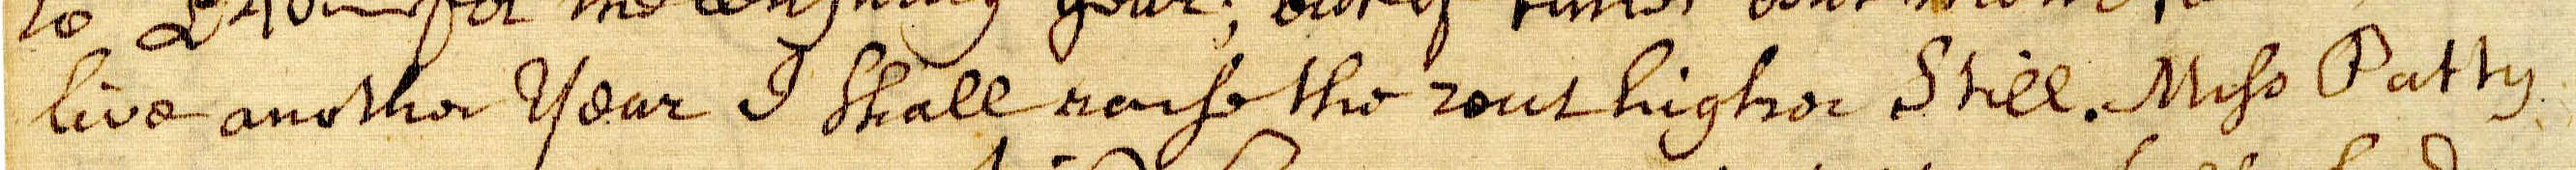live another & Year I shall raise the rent higher Still. Miss Patty
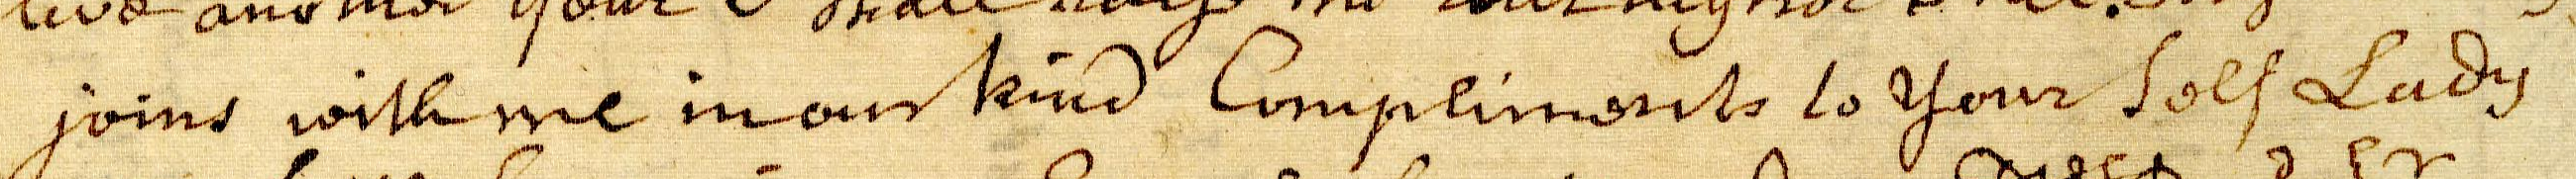joins with me in our kind Compliments to Your Self Lady
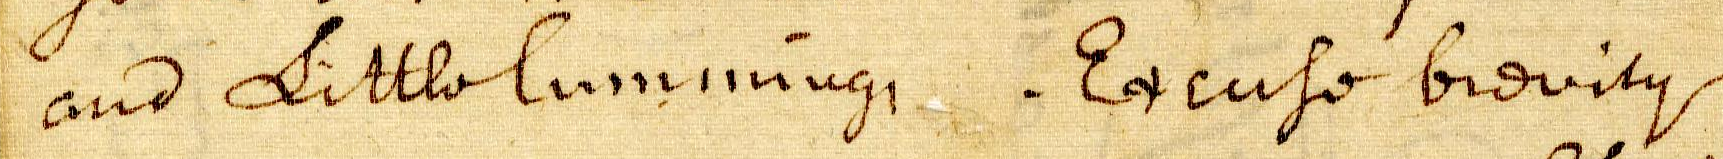and Little Cummings- Excuse brevity.
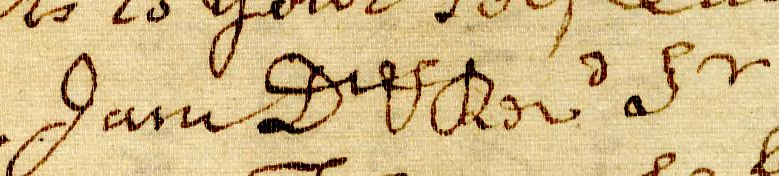I am D^r & Rev^d S^r
